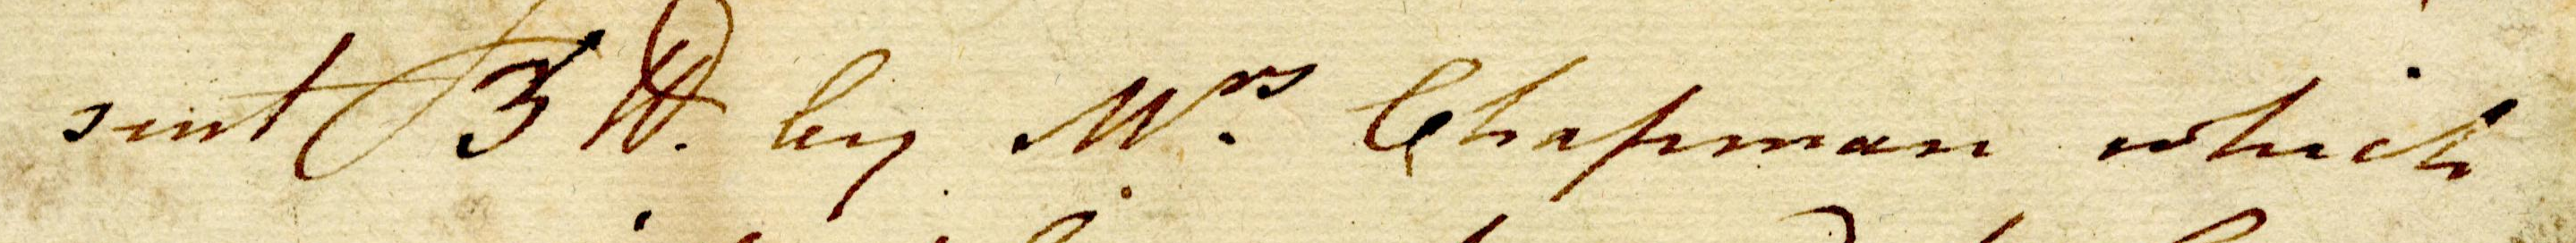sent 3 lb. by M^rs. Chapman which
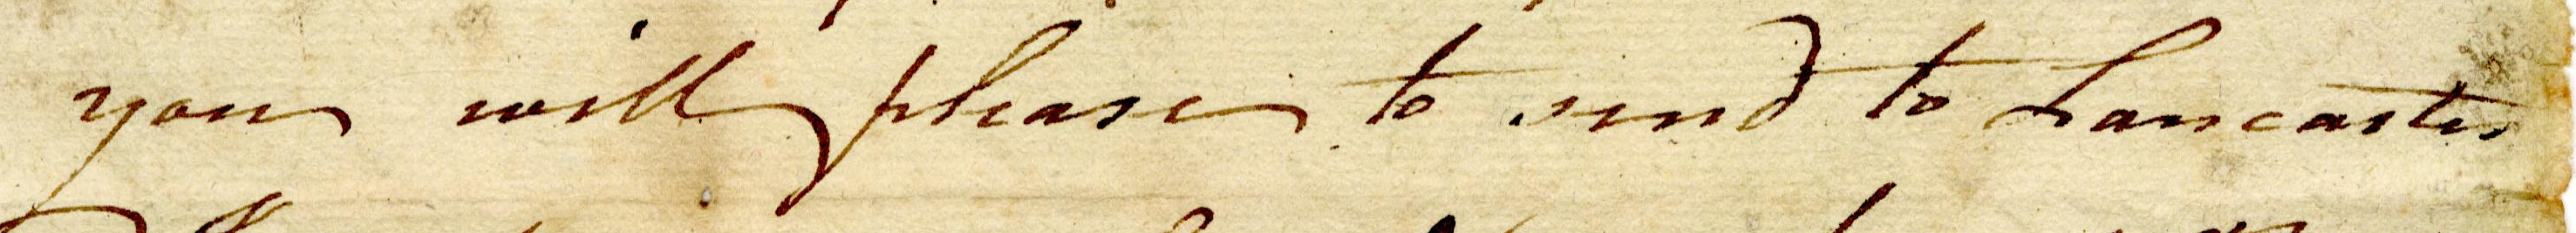you will please to send to Lancaster
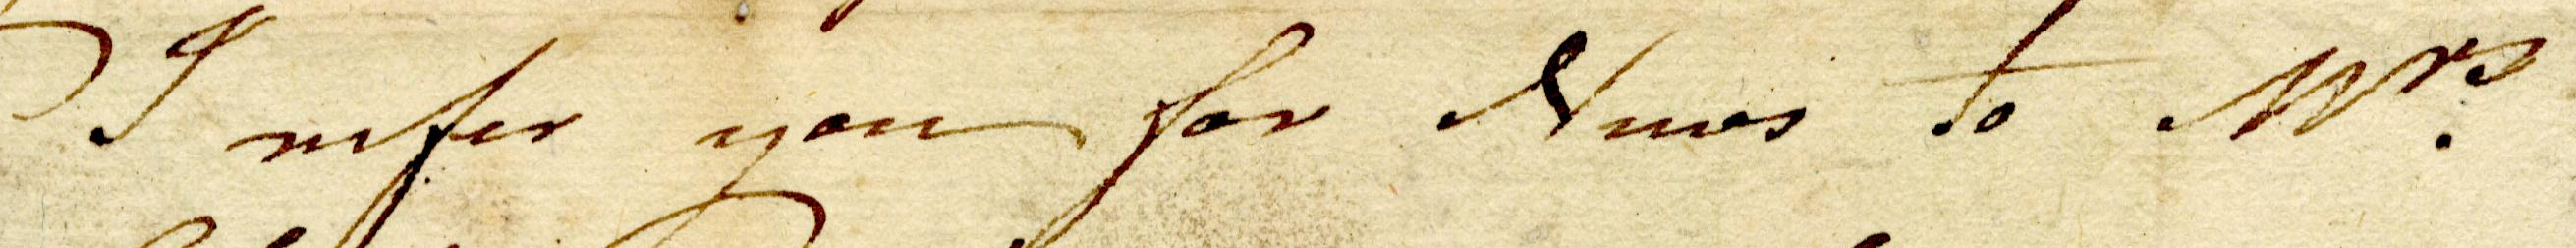I refer you for News to M^rs
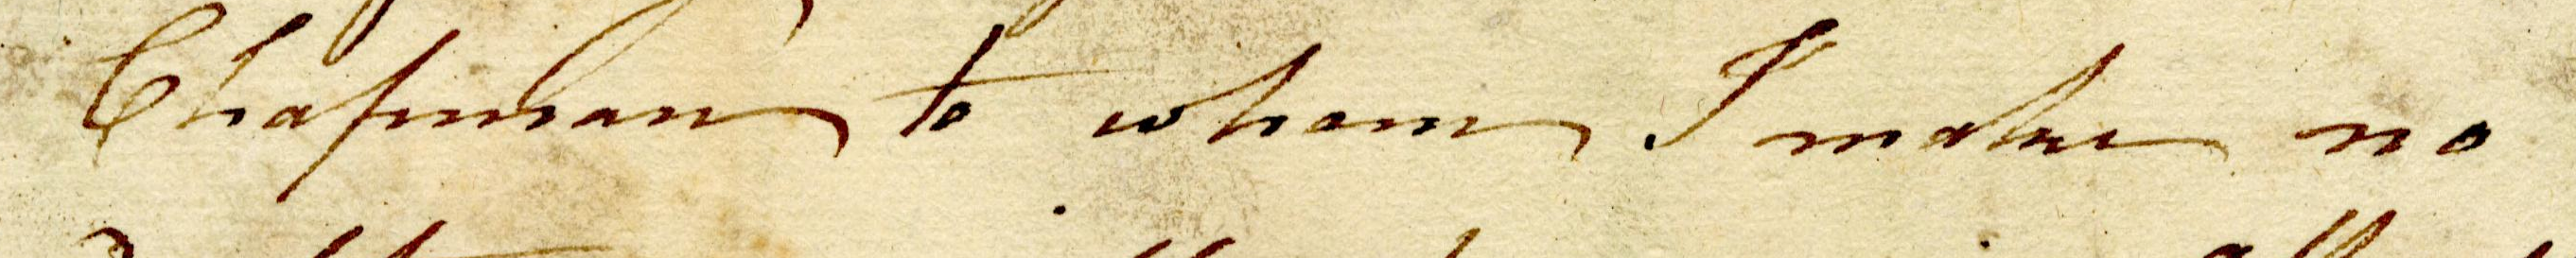Chapman to whom I make no
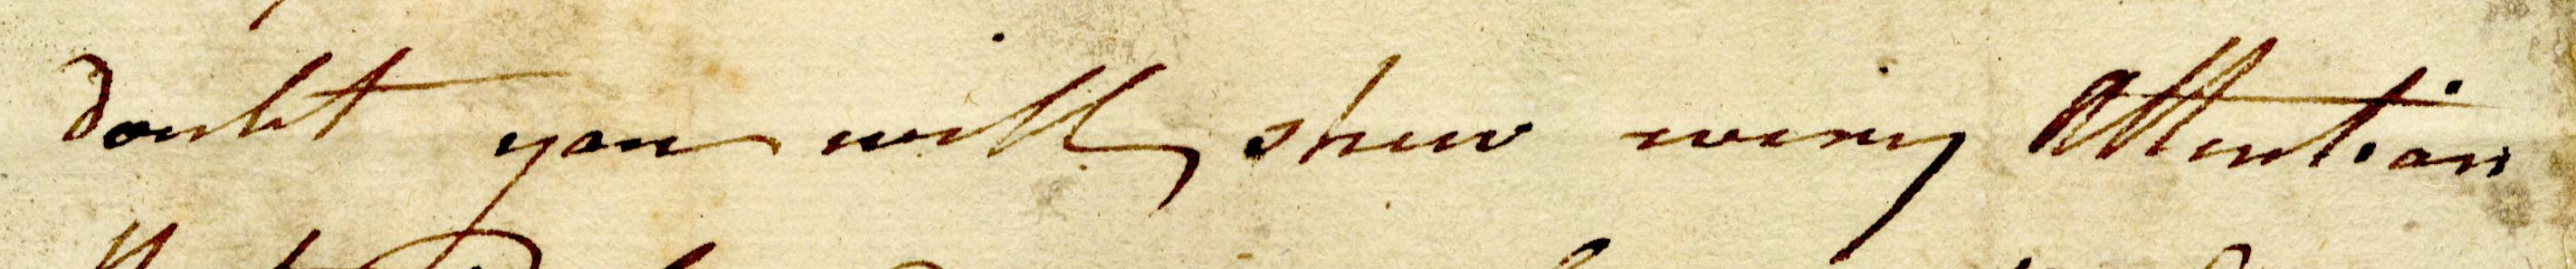doubt you with shew every attention
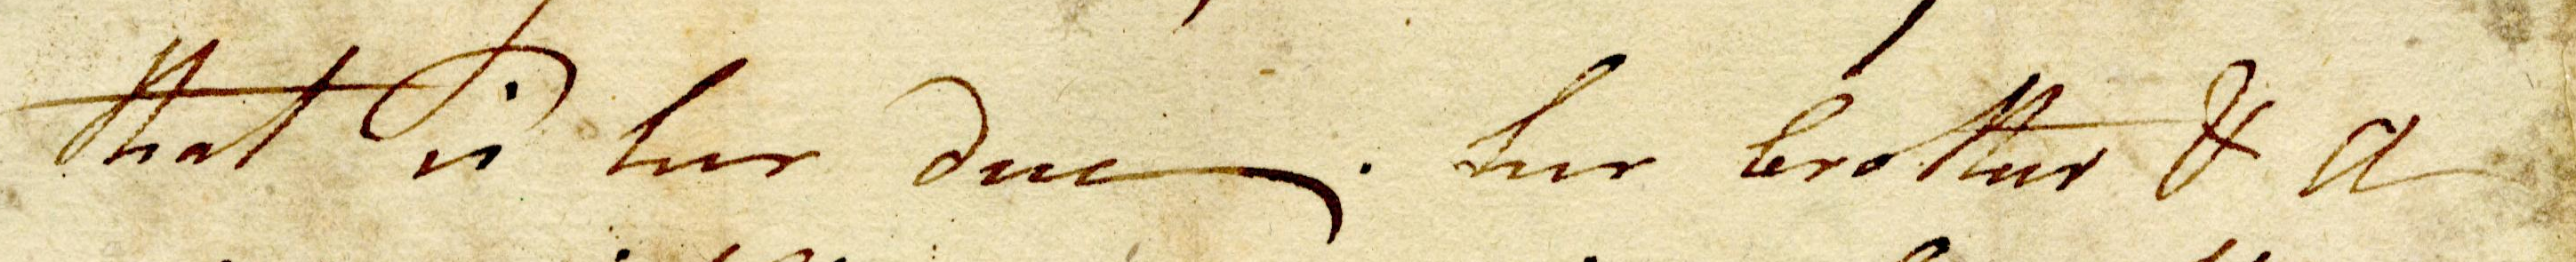that is her due: her brother & A
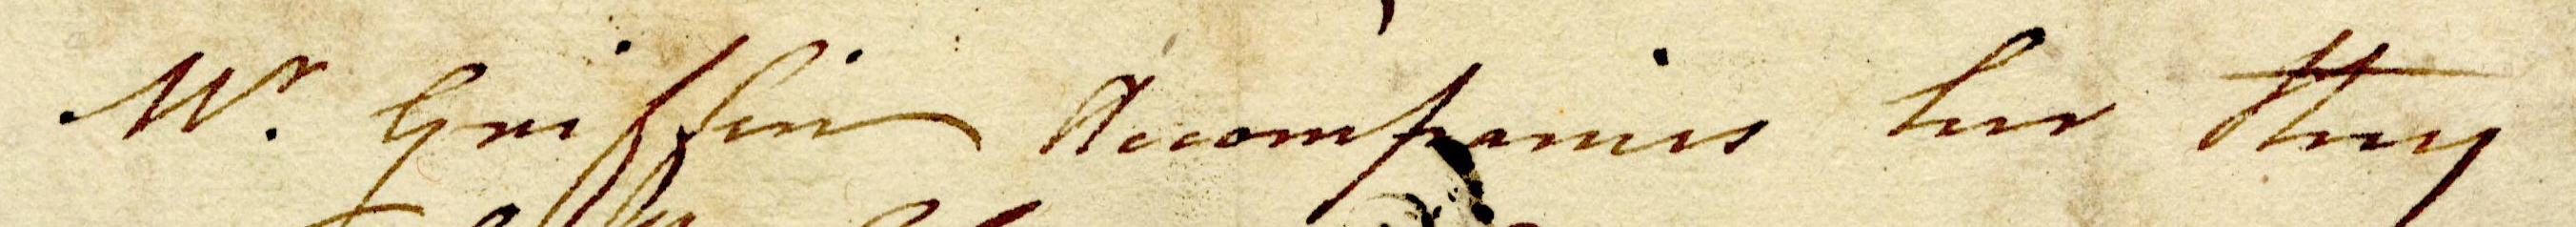M^r. Griffin accompanies her they
